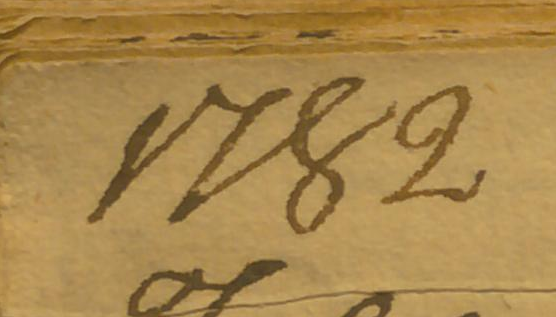1782
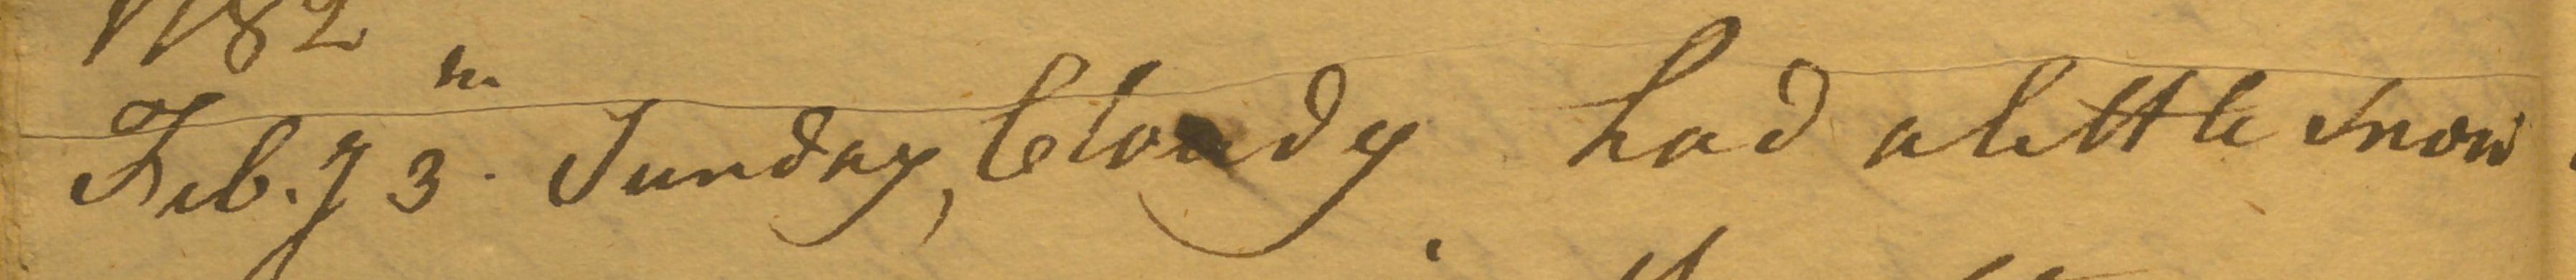Feb.^y 3^th. Sunday, Cloudy had a little snow
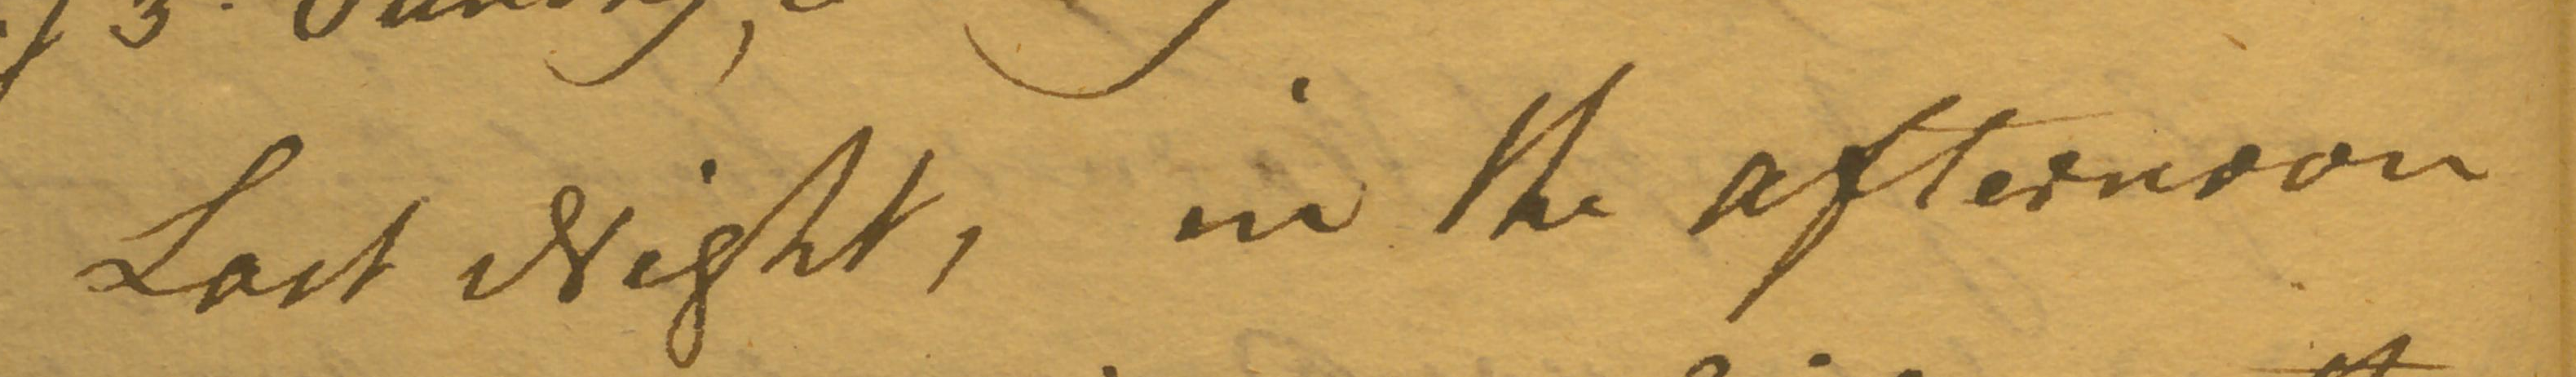Last Night, in the afternoon
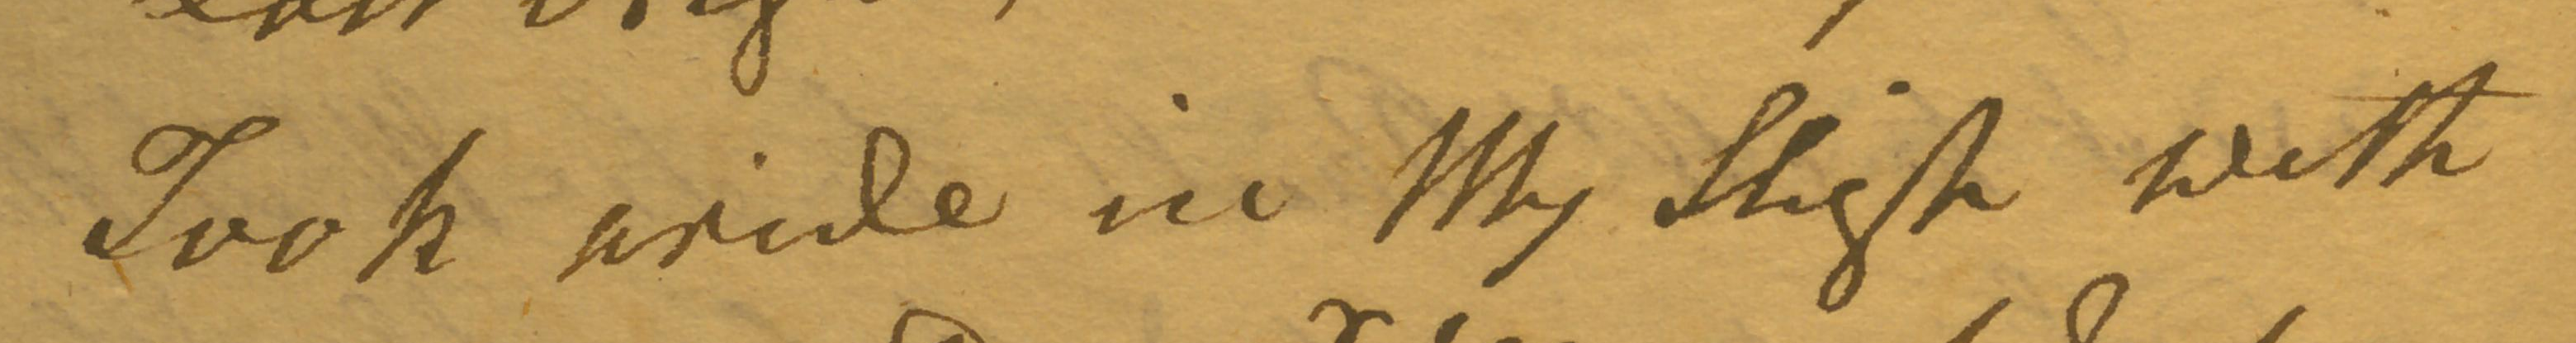Took a ride in My Sleigh with
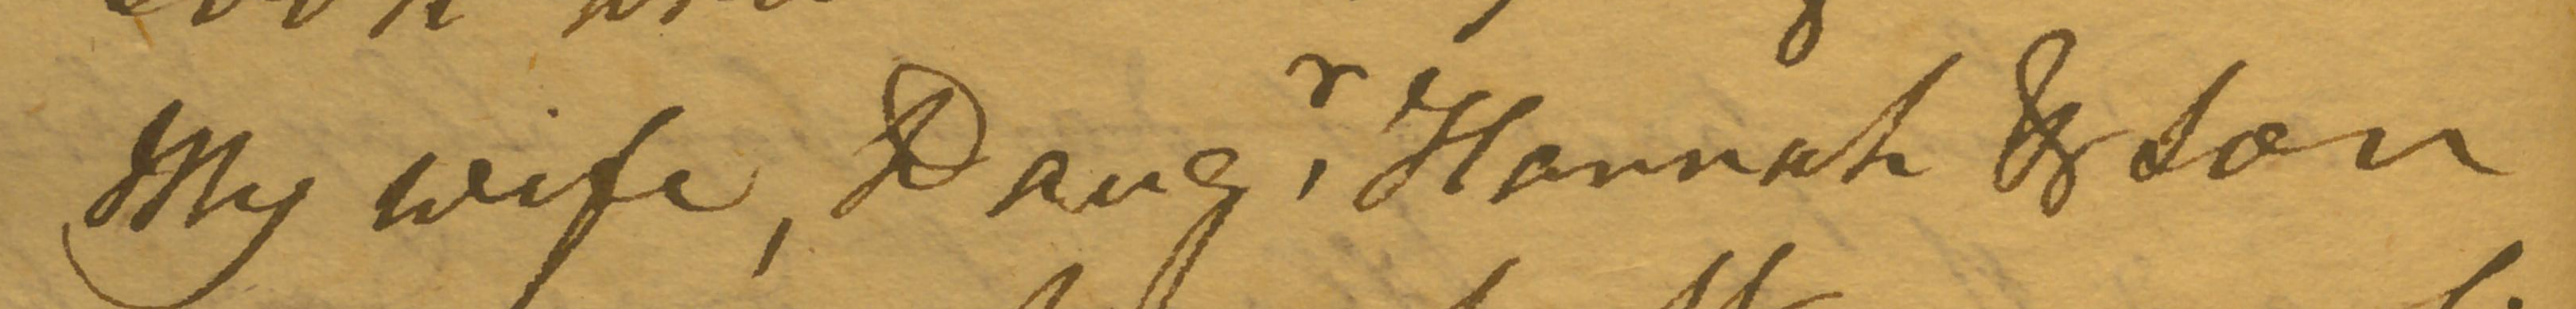My wife, Daug^r. Hannah & son
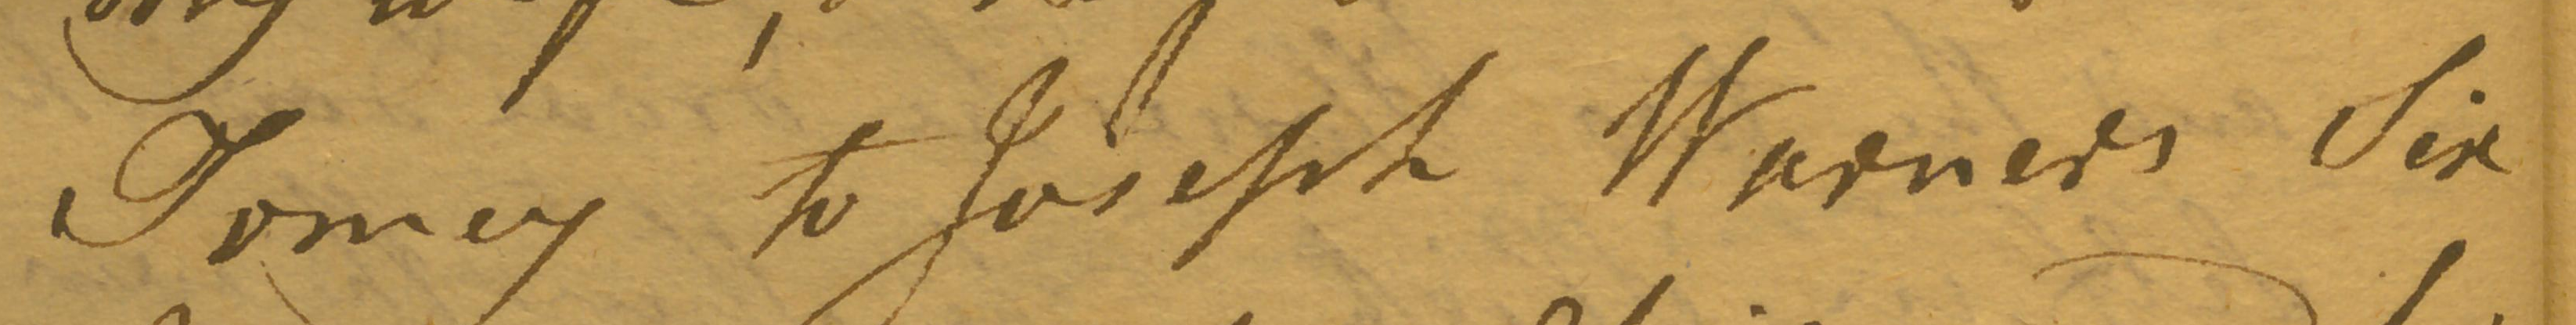Tomey to Joseph Warners Six
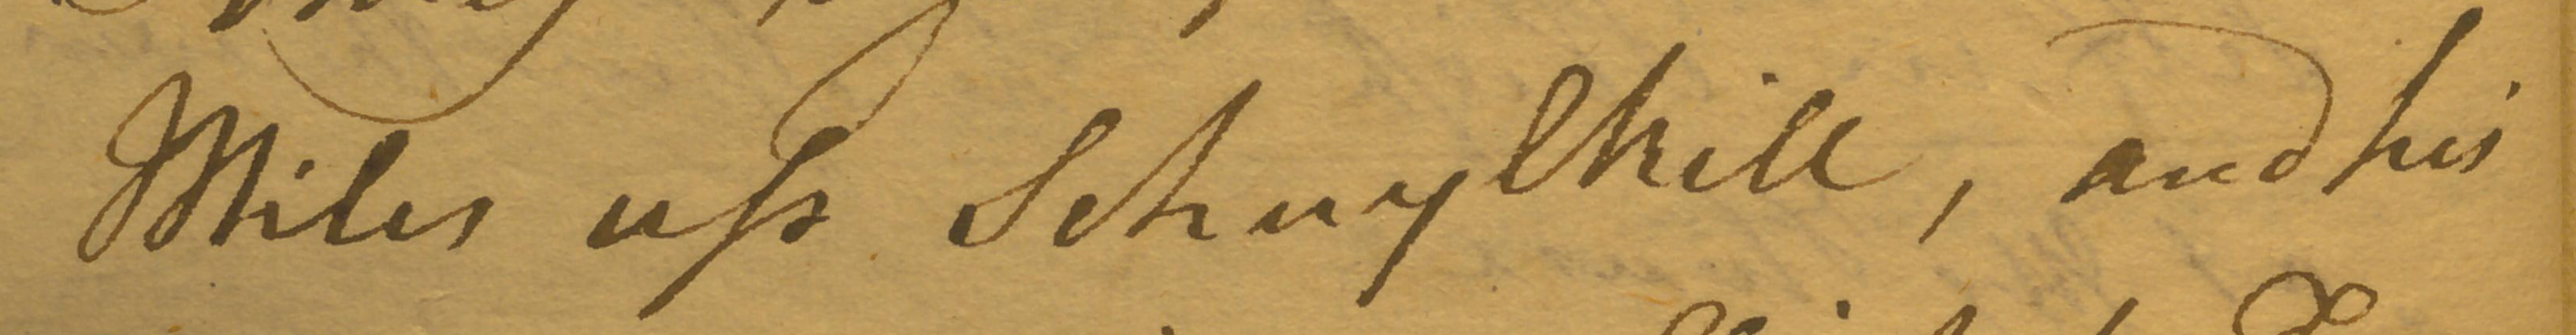Miles up Schuylkill, and his
